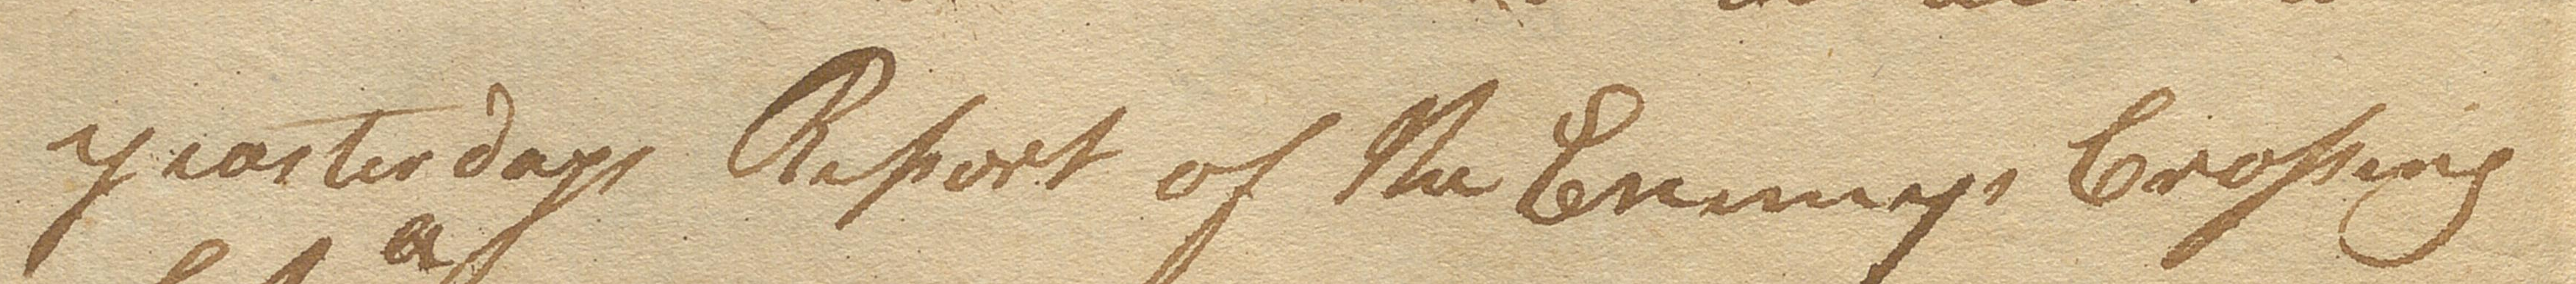yeasterdays Report of the Enemys Crossing
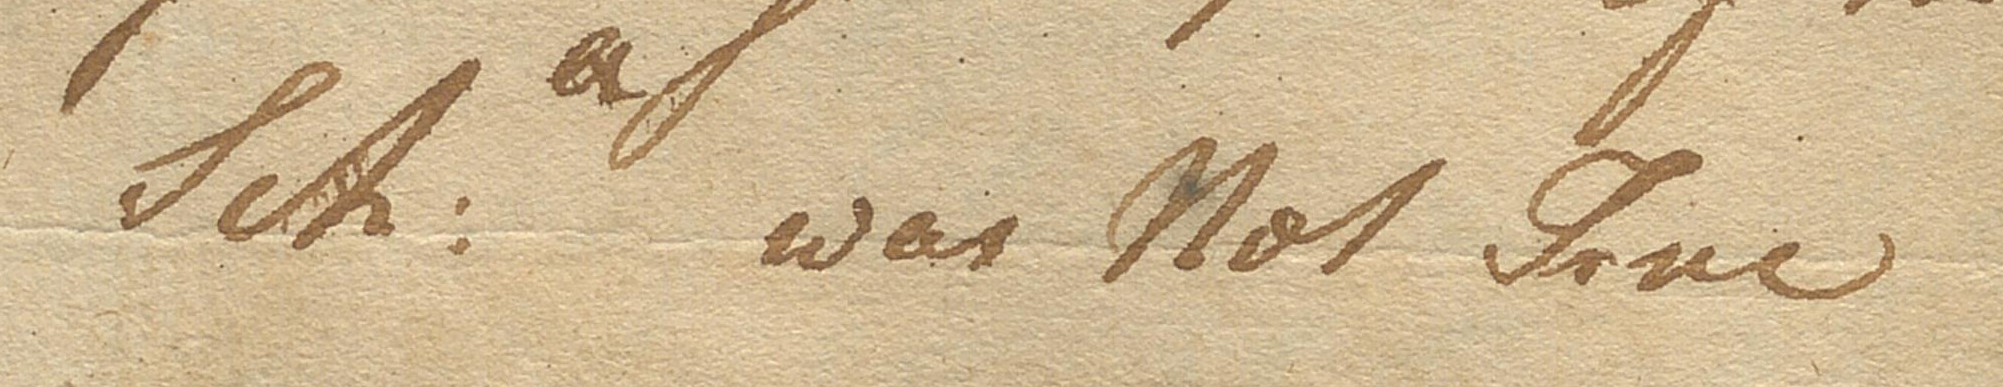Sch^a. was Not True
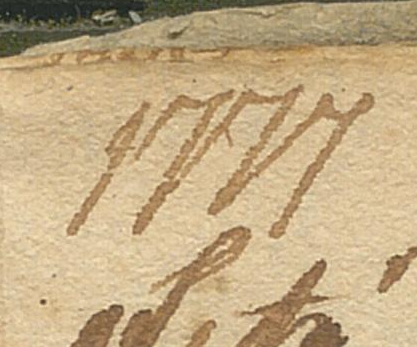1777
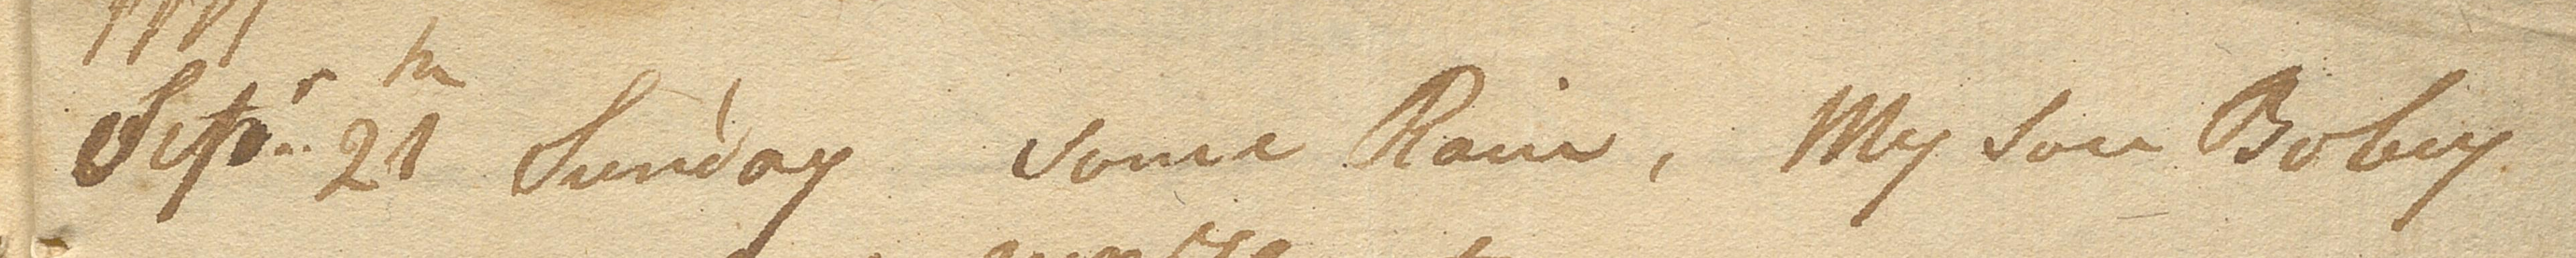Sep^r. 21^th Sunday some Rain. My son Bobey
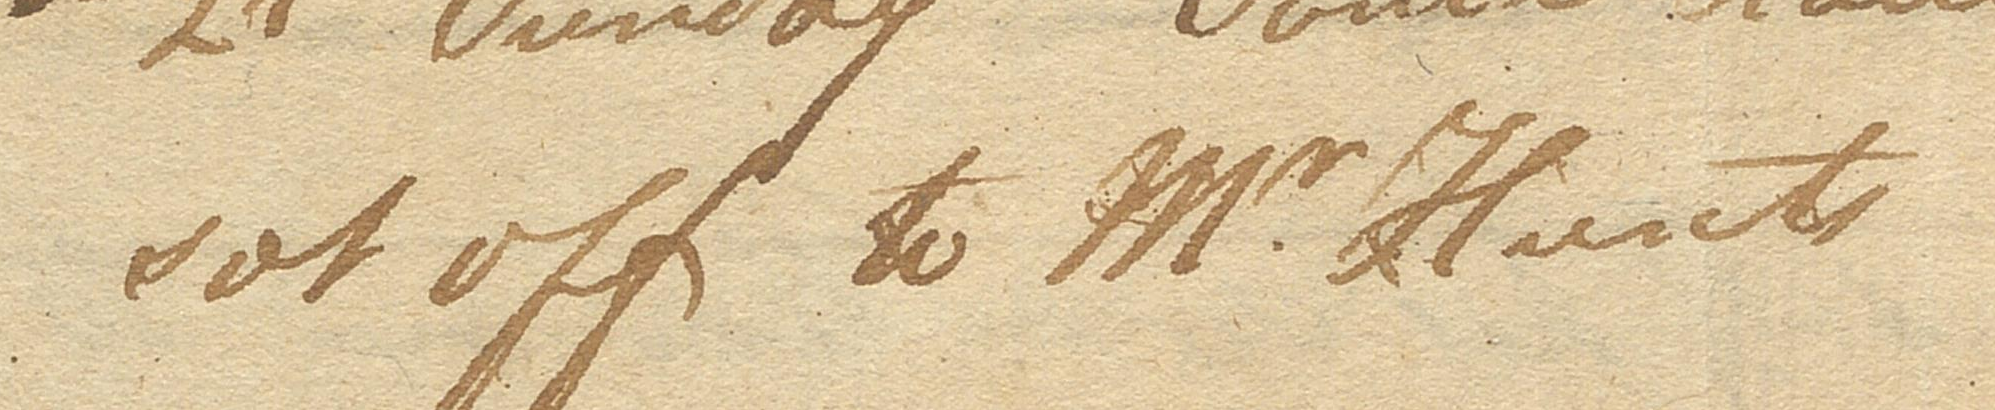set off to M^r. Hunts
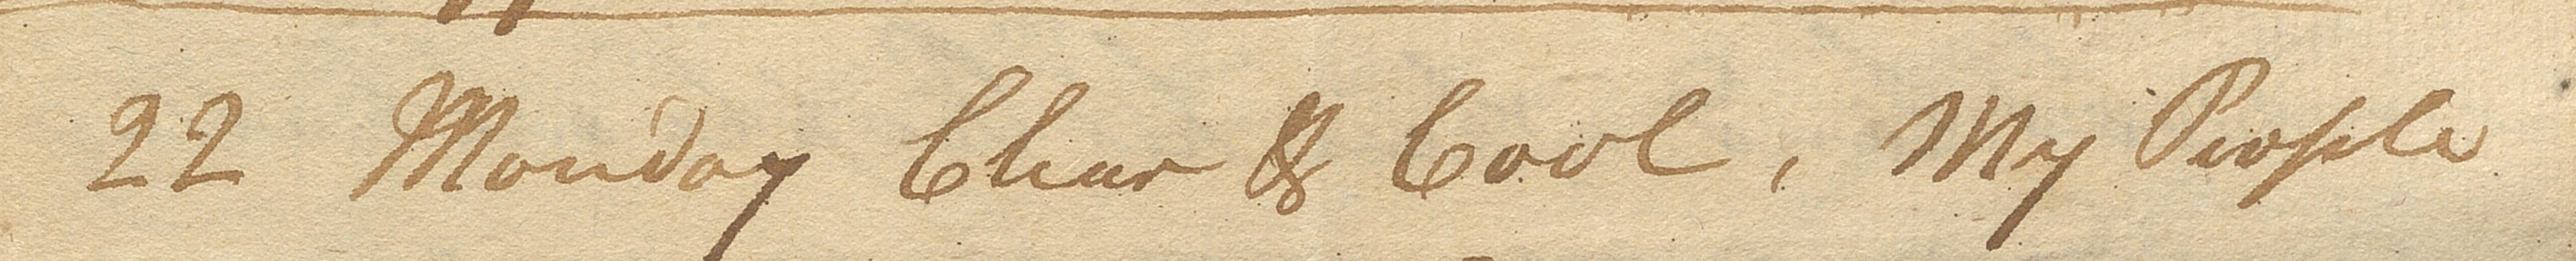22 Monday Clear & Cool, My People
